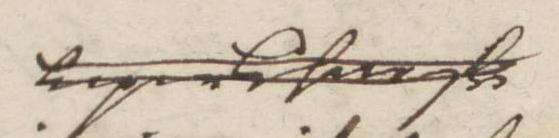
weder de dem Babylonischen
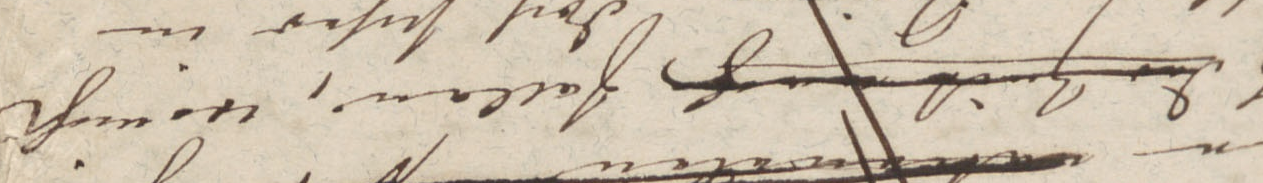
schen fast eben so nahe verwandt,
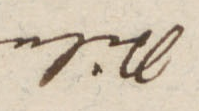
und selbst d
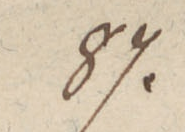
87.
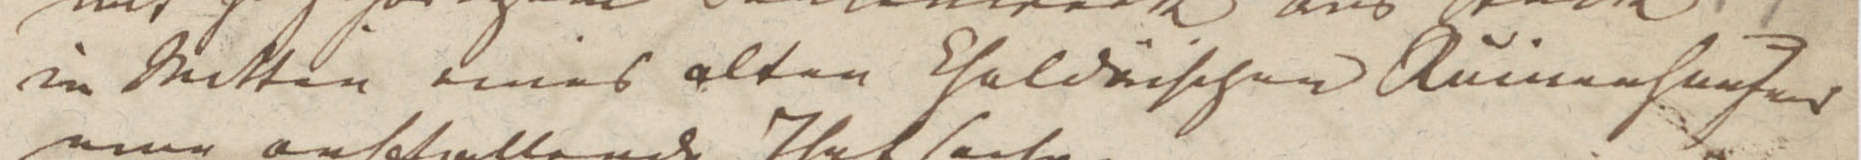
in Mitten eines alten Chaldäischen Ruinenhaufens
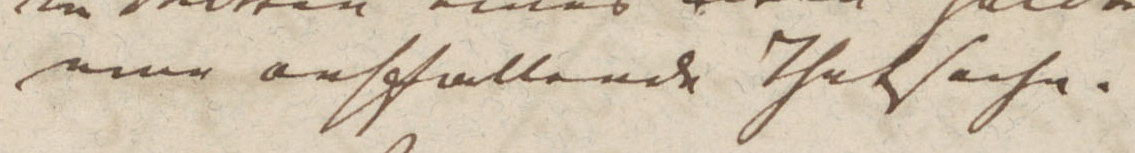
eine auffallende Thatsache.
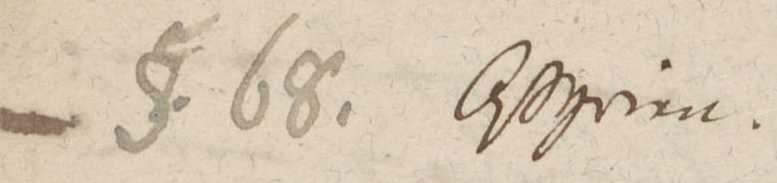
§. 68. Assyrien.
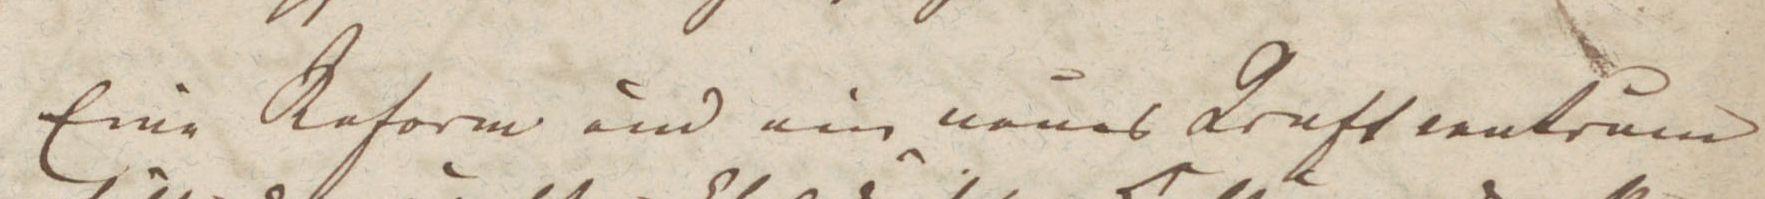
Eine Reform und ein neues Kraftcentrum
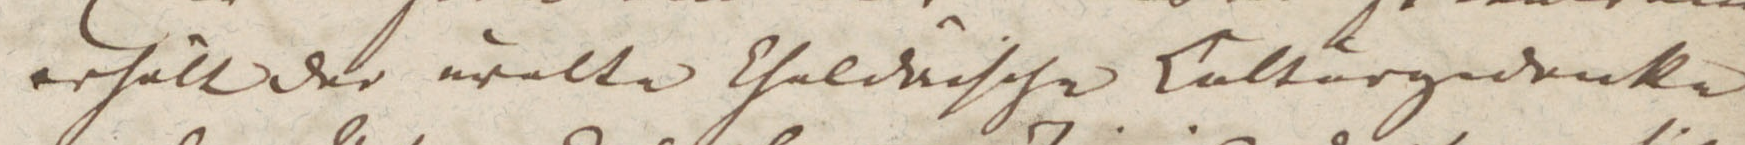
erhält der uralte Chaldäische Culturgedanke
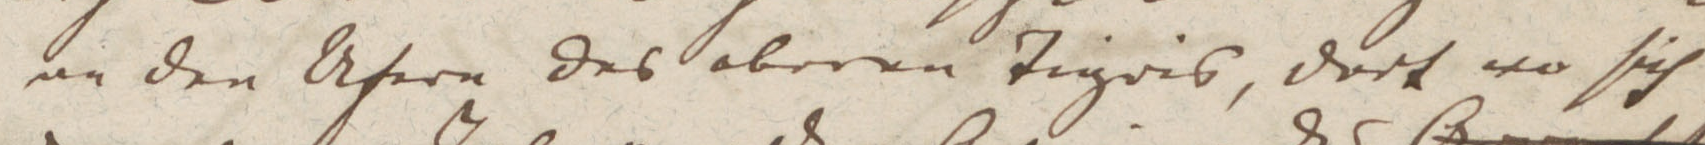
an den Ufern des oberen Tigris, dort wo sich
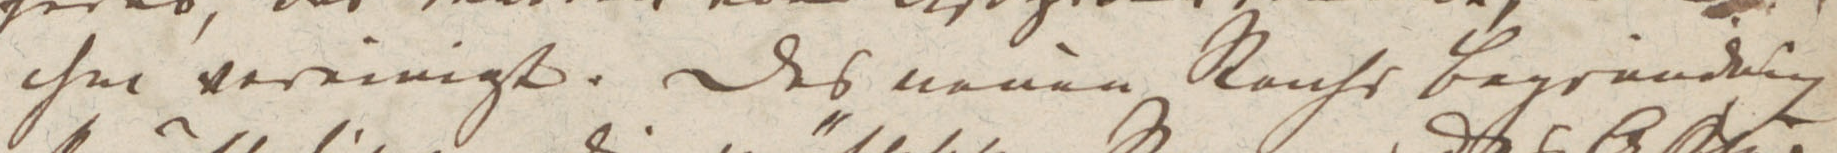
ihm vereinigt. Des neuen Reichs Begründung
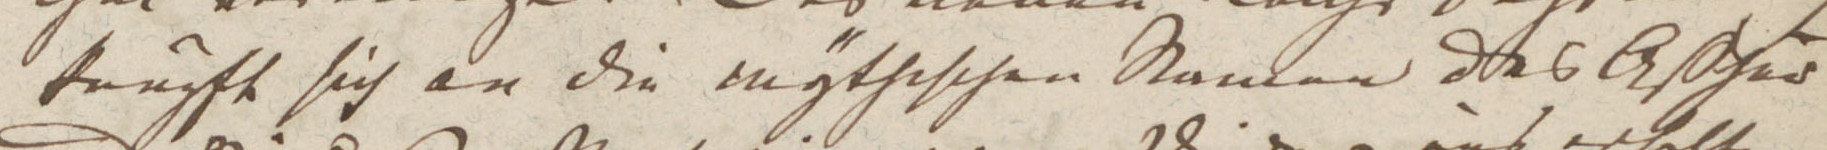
knüpft sich an die mythischen Namen des Asshur
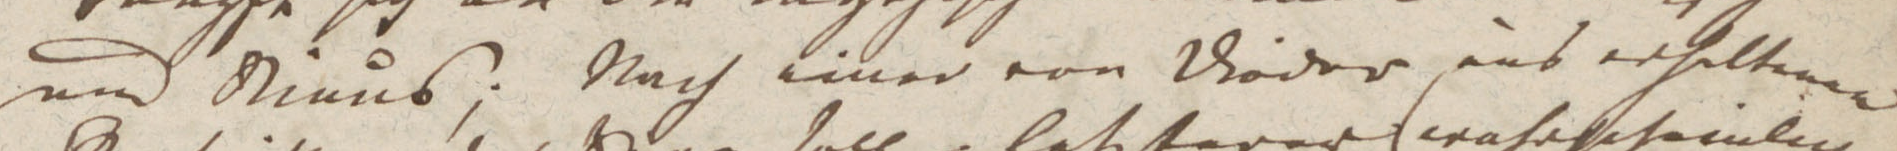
und Ninus; Nach einer von Diodor uns erhaltenen
